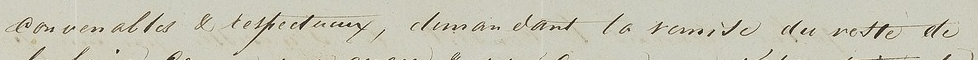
convenables et respectueux, demandant la remise du reste de
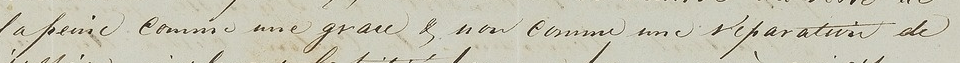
la peine comme une grace & non comme une réparation de
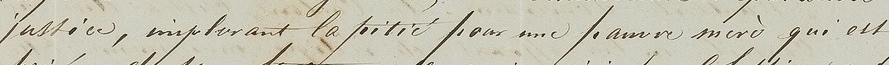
justice, implorant la pitié pour une pauvre mère qui est
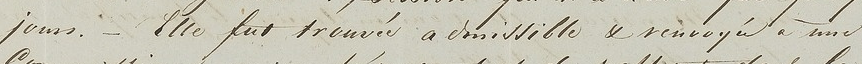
jours. – Elle fut trouvée admissible & renvoyée à une
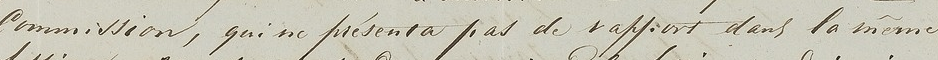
commission, qui ne présenta pas de rapport dans la même
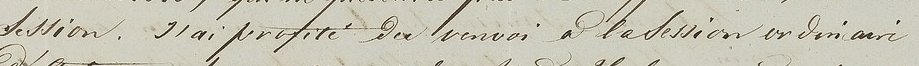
Session. J'ai profité du renvoi à la session ordinaire
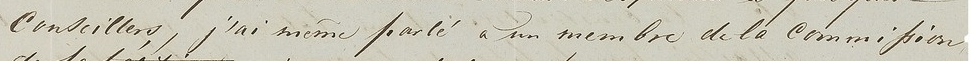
conseillers, j'ai même parlé à un membre de la commission
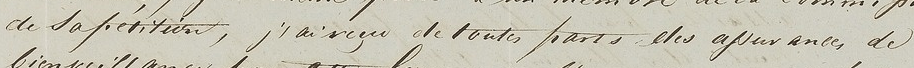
de sa pétition, j'ai reçu de toutes parts des assurances de
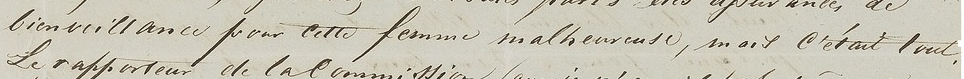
bienveillance pour cette femme malheureuse, mais c'était tout.
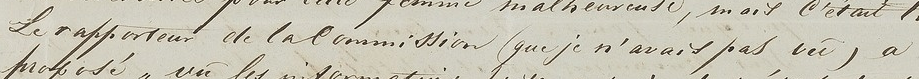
Le rapporteur de la commission (que je n'avais pas vu) a
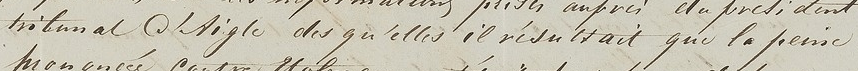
tribunal d'Aigle desquelles il résultait que la peine
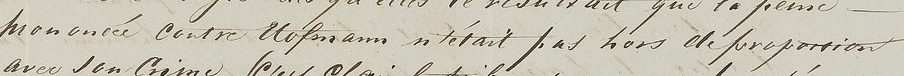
prononcé contre Hofmann n'était pas hors de proportion
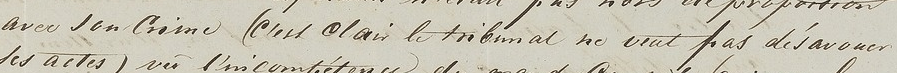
avec son crime (c'est clair que le tribunal ne veut pas désavouer
